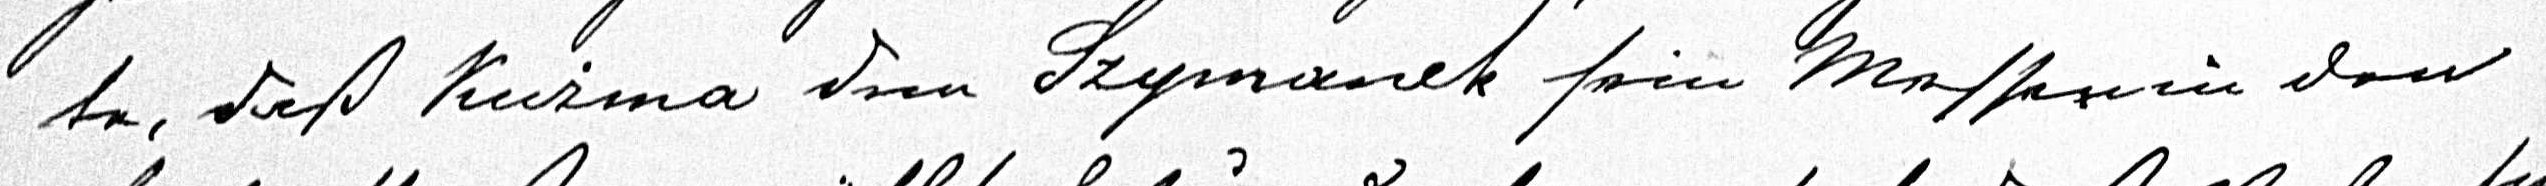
te, daß Kuźma dem Szymanek sein Messer in den
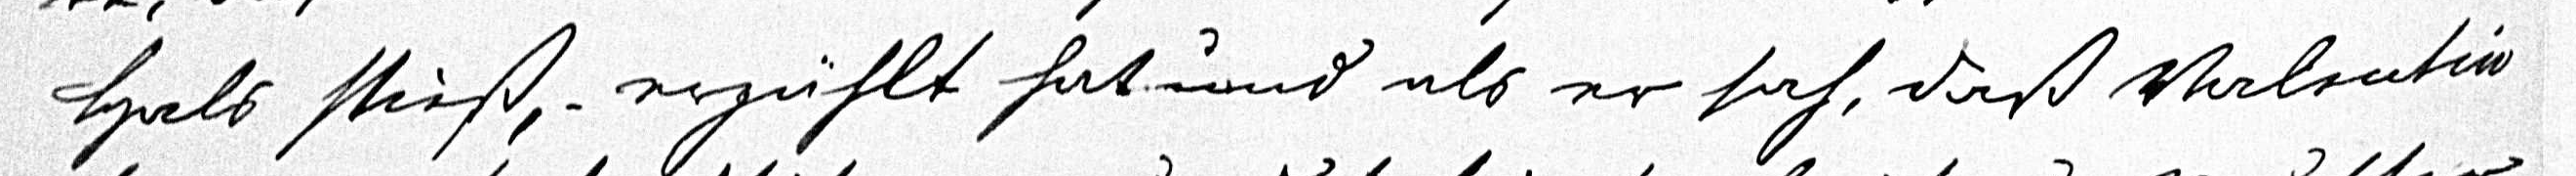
Hals stieß, erzählt hat und als er sah, daß Valentin
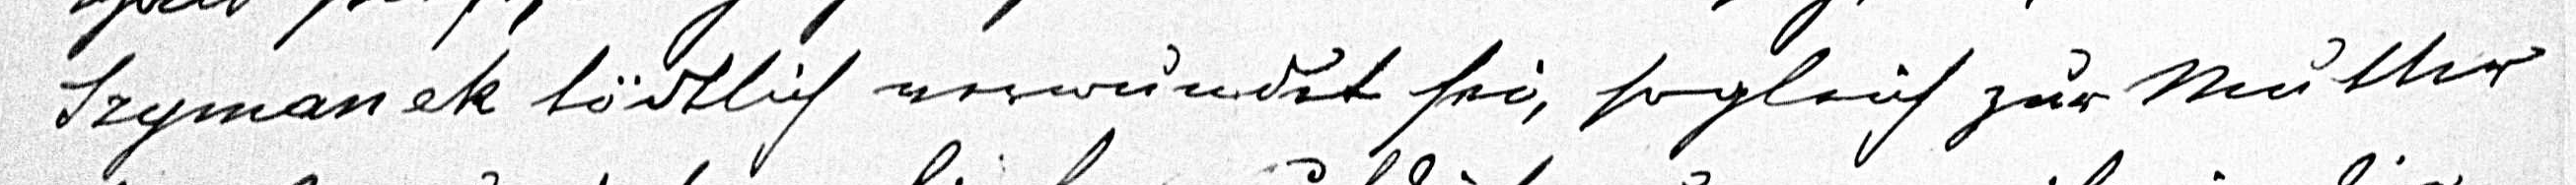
Szymanek tödlicht verwundet sei, sogleich zur Mutter
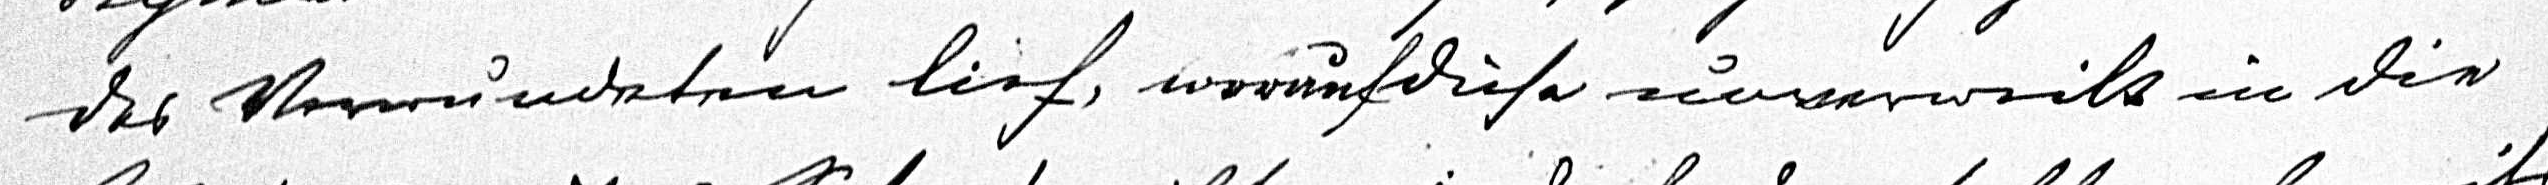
des Verwundeten lief, worauf diese unverweils in die
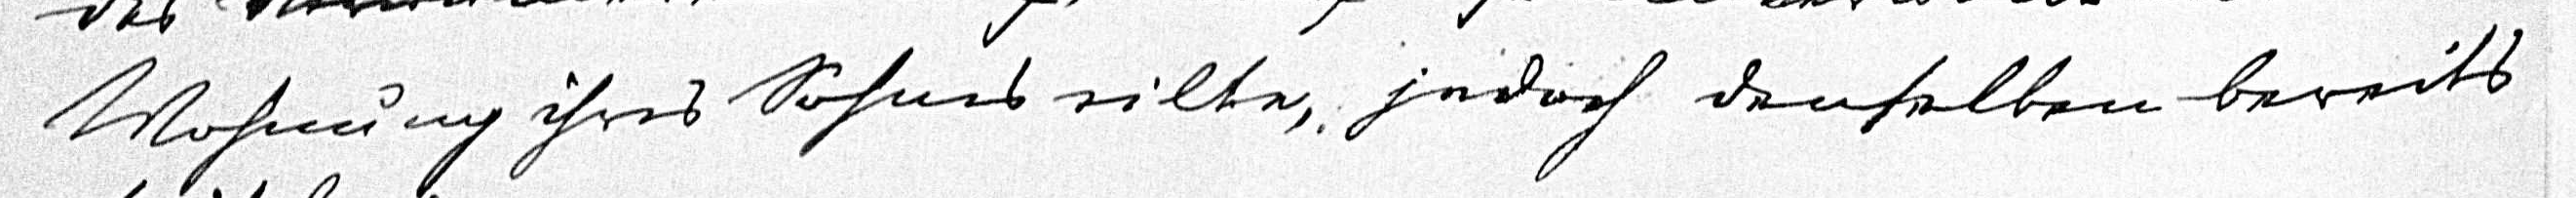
Wohnung ihres Sohnes eilte, jedoch denselben bereits
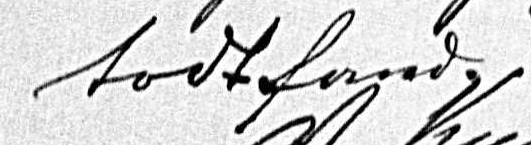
todt fand.
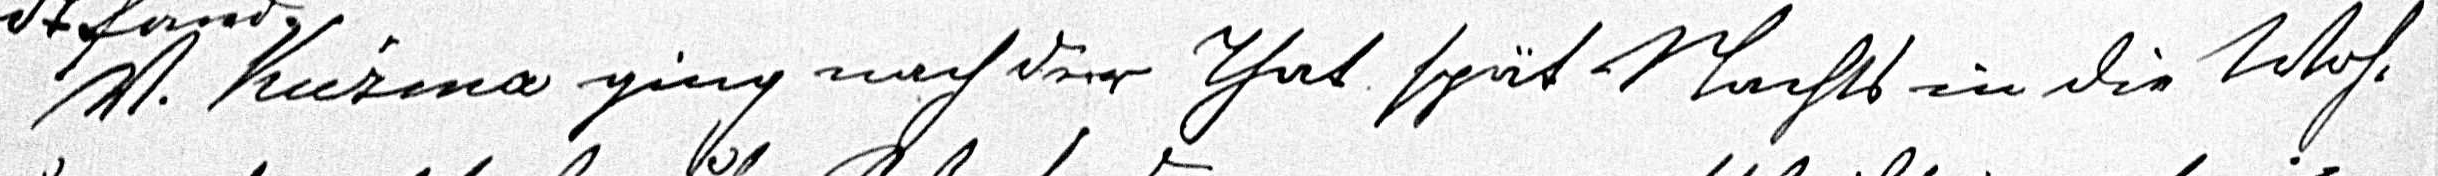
V. Kuźma ging nach der That spät Nachts in die Who¬
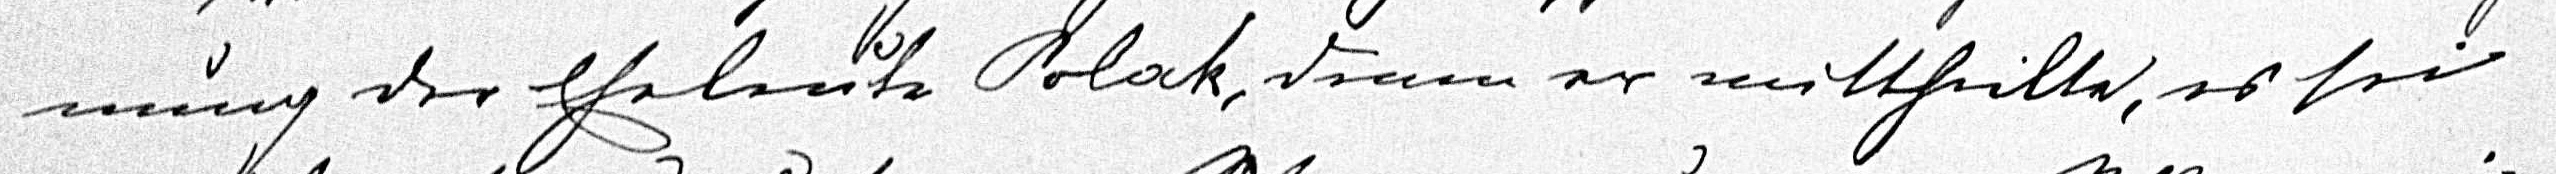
nung der Eheleute Polak, denen er mittheilte, es sei
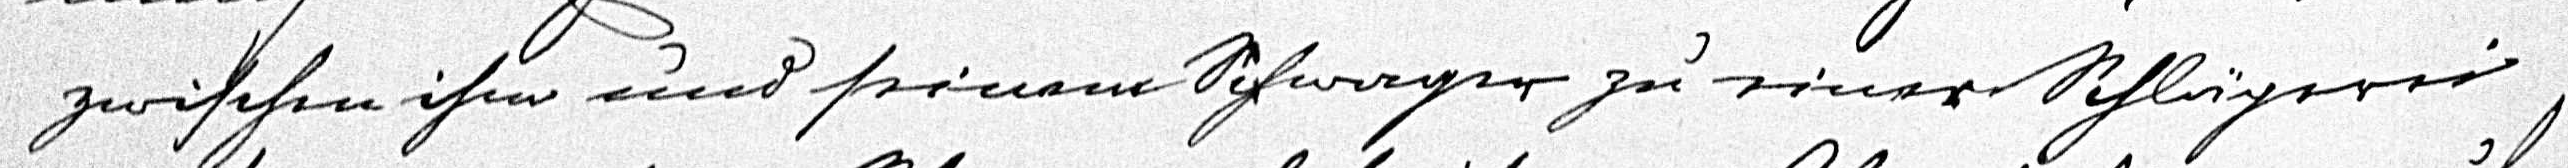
zwischen ihm und seinem Schwager zu einer Schlägerei
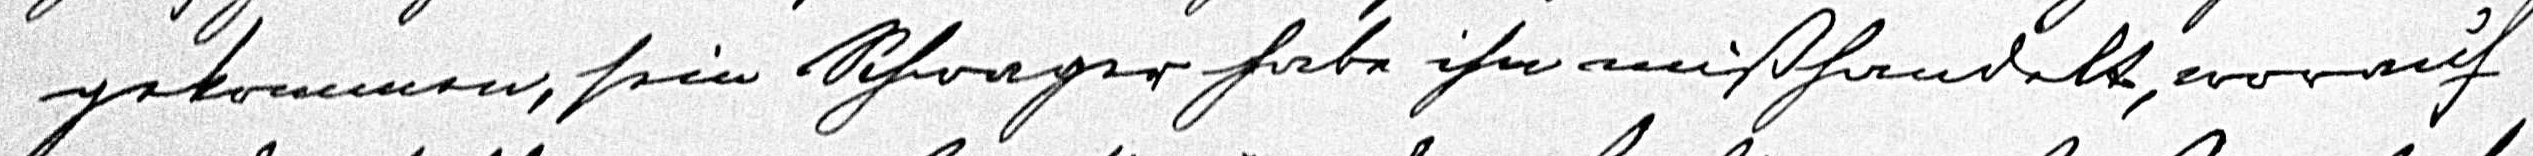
gekommen, sein Schwager habe ihn mißhandelt, worauf
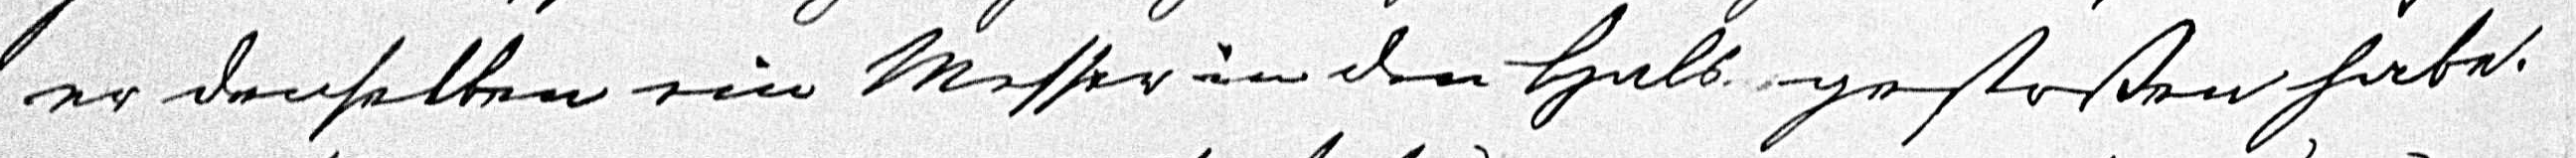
er denselben ein Messer in den Hals gestoßen habe.
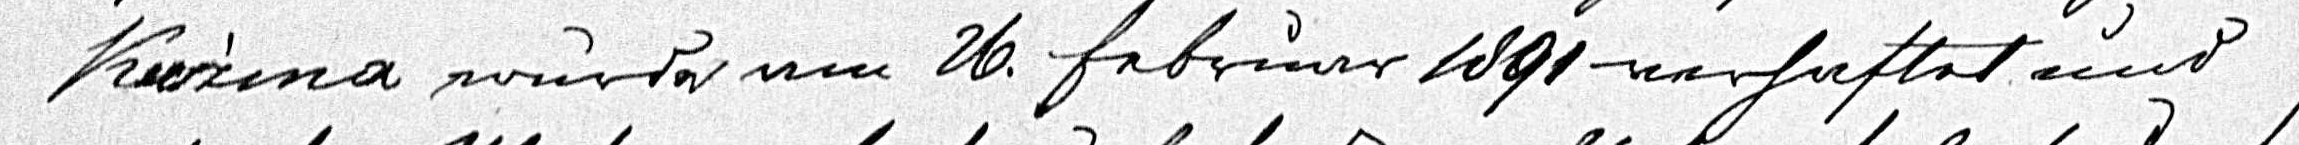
Kuźma wurde am 26. Februar 1891 verhaftet und
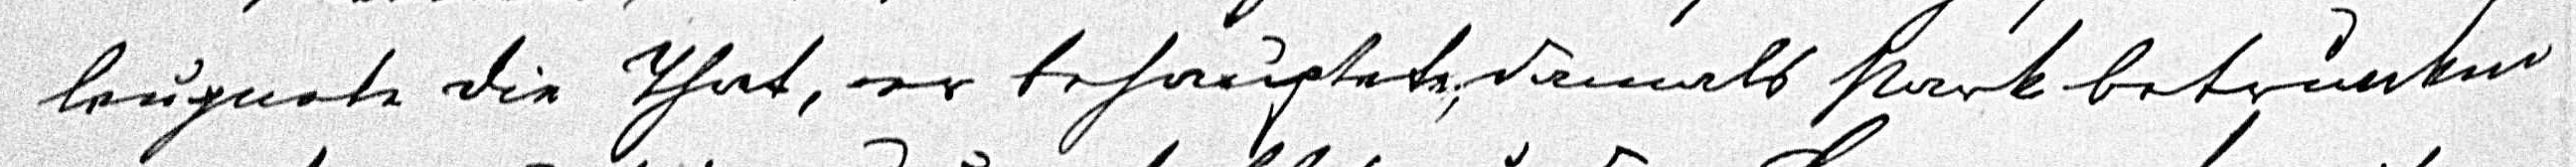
leugnete die That, er behauptete, damals stark betrunken
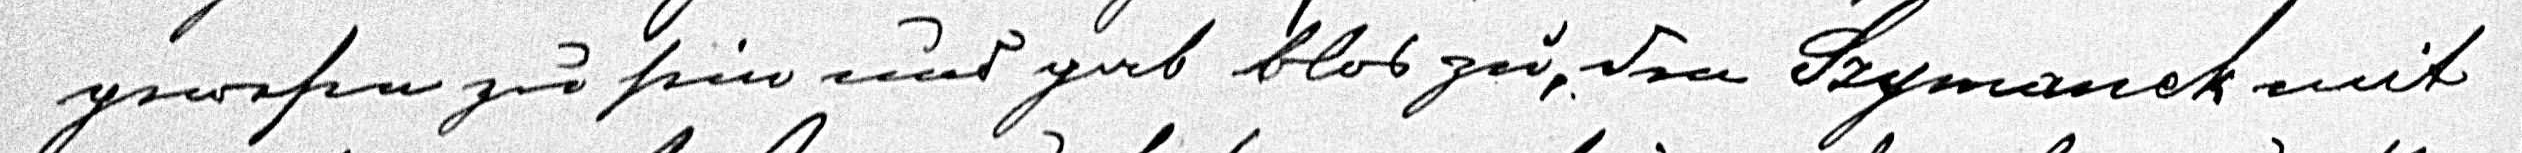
gewesen zu sein und gab blos zu, den Szymanek mit
